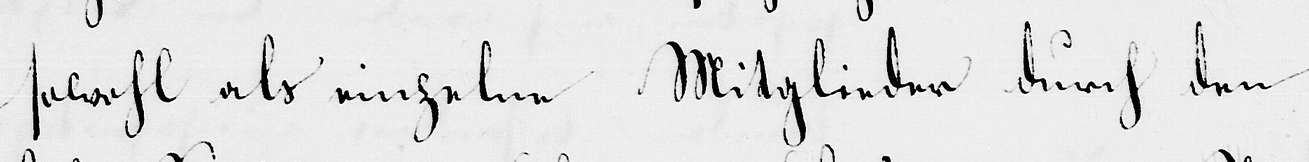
sowohl als einzelne Mitglieder durch den
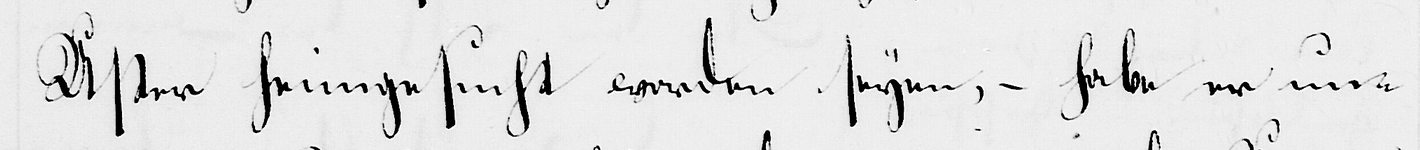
ster heimgesucht worden seyen, – habe er un¬
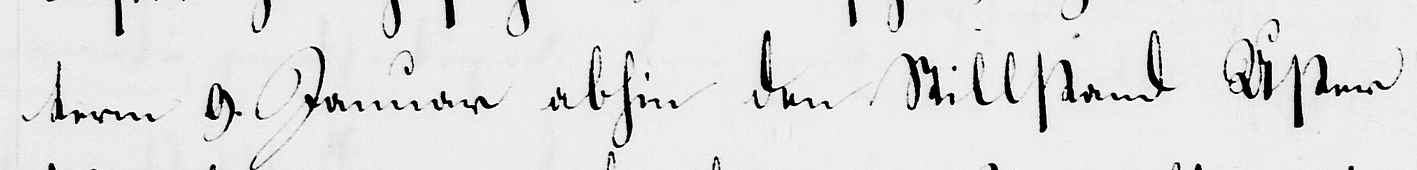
term 9. Januar abhin den Stillstand Uster
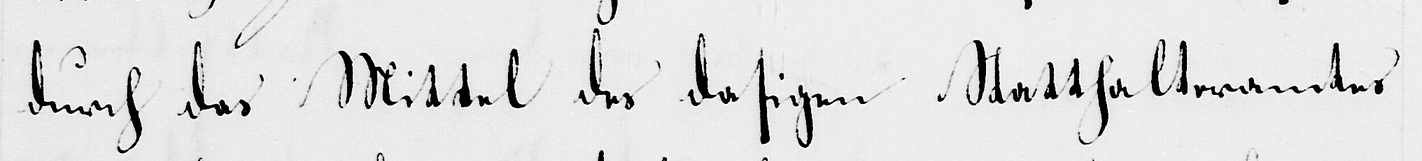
durch das Mittel des dasigen Statthalteramtes
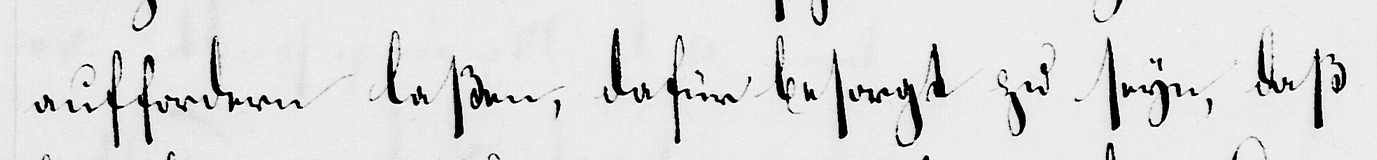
auffordern laßen, dafür besorgt zu seyn, daß
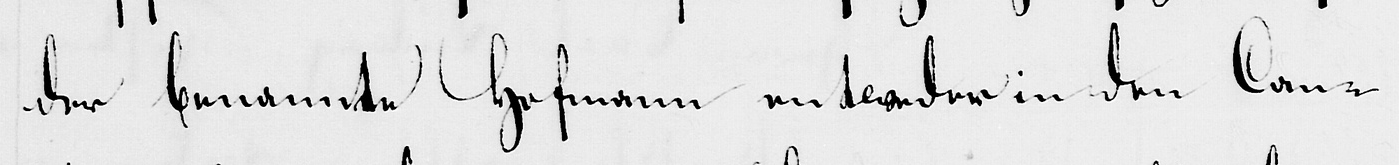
der benannte Hofmann entweder in den Can¬
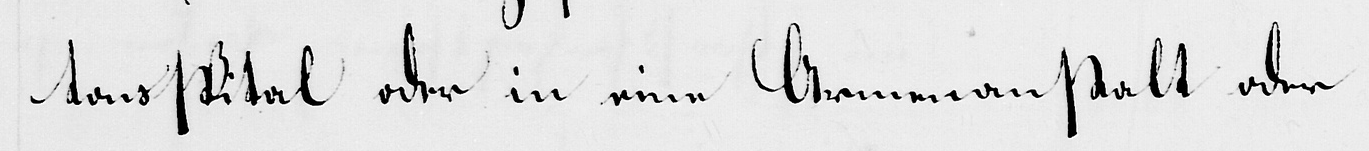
tonsspital oder in eine Armenanstalt oder
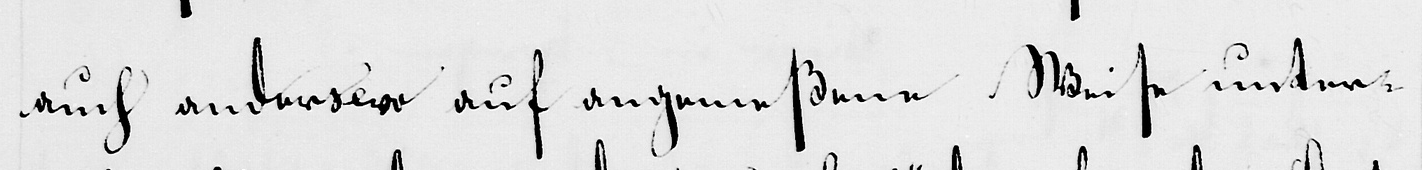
auch anderswo auf angemeßene Weise unter¬
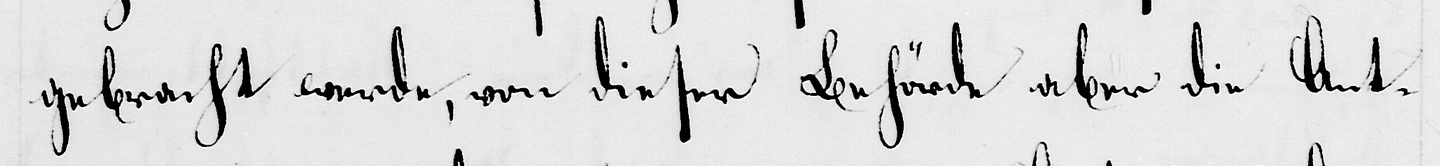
gebracht werde, von dieser Behörde aber die Ant¬
